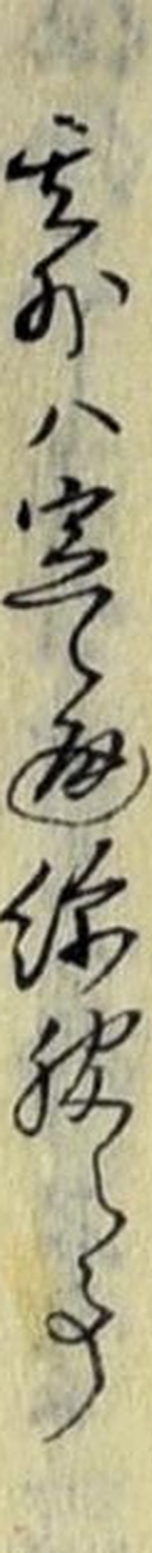其外ハ定之通綿服之事
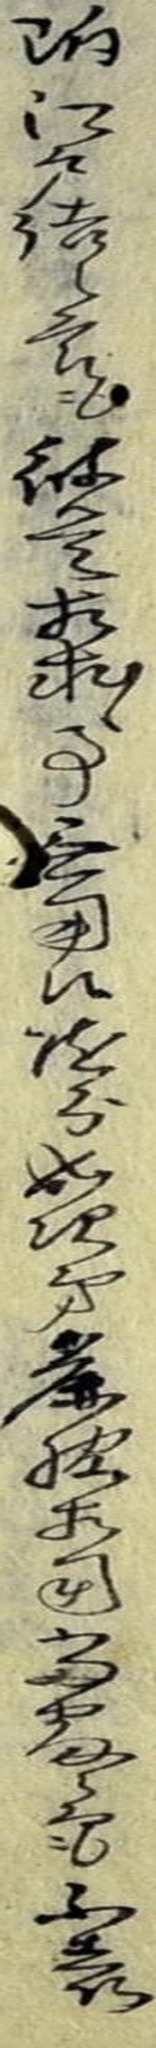附江戸詰之節も彼是相求候事無用候随分成次第麁服相用当番ニ而も不表
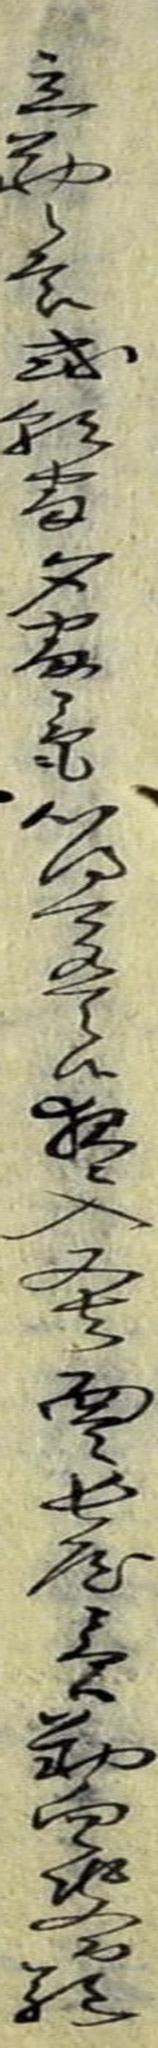立勤之節或朝番夕番ニ而も心得可有之候夜ニ入又者面々長屋ニ而ハ勤向決而難
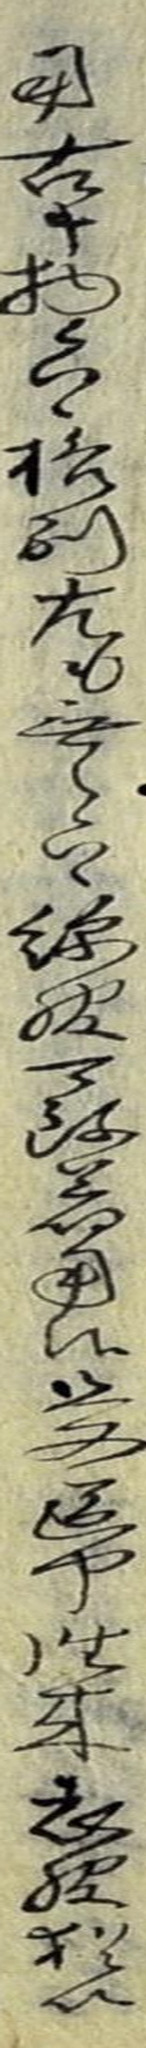用古キ物候ハヽ格別左も無之候ハヽ綿服可致着用候且又道中往来衣服猶以
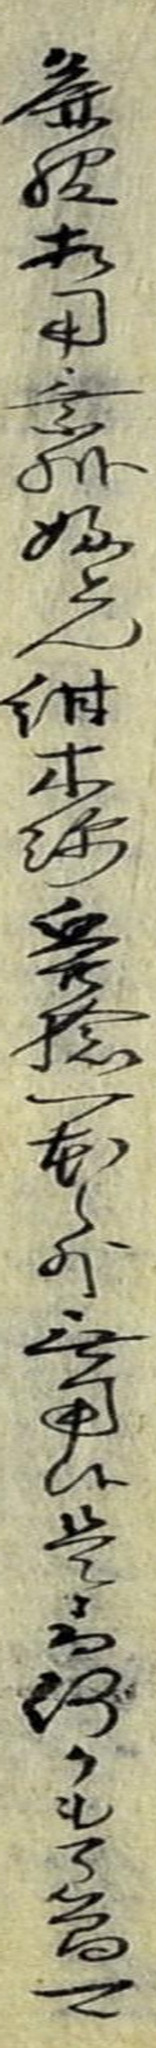麁服相用乗掛ふとん紺木綿鼻捻一本之外無用候是ニ而何かも了簡可
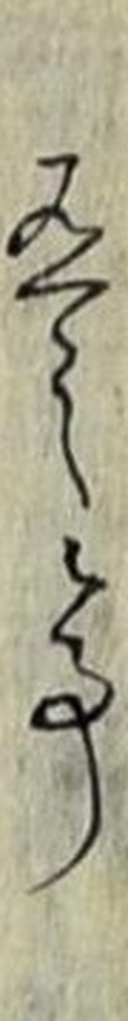有之候事
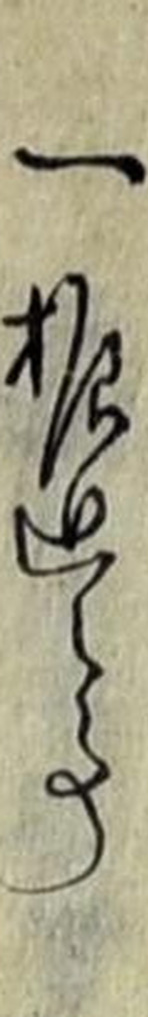一振廻之事
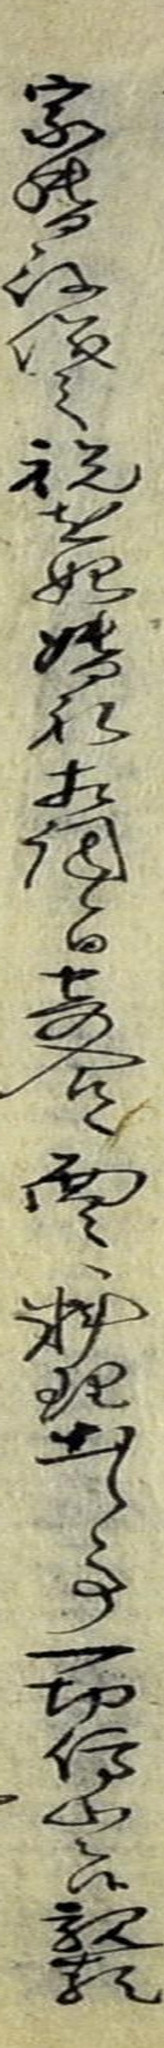家督役儀之祝を始婚礼相調候日寄合候面々へ料理出候事一切停止ニ候親類
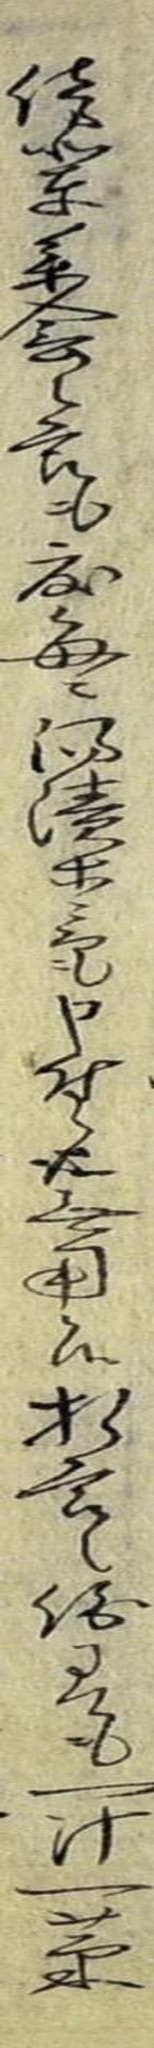傍輩参会之節も度毎ニ湯漬等ニ而も申付候儀無用ニ候折節之儀にても一汁一菜
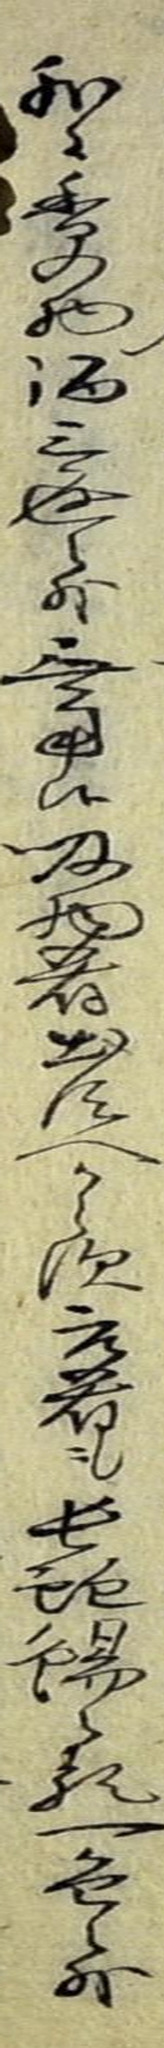外ニ香の物酒三遍之外無用候吸物肴出すへからす取肴も長鮑鯣之類一色之外
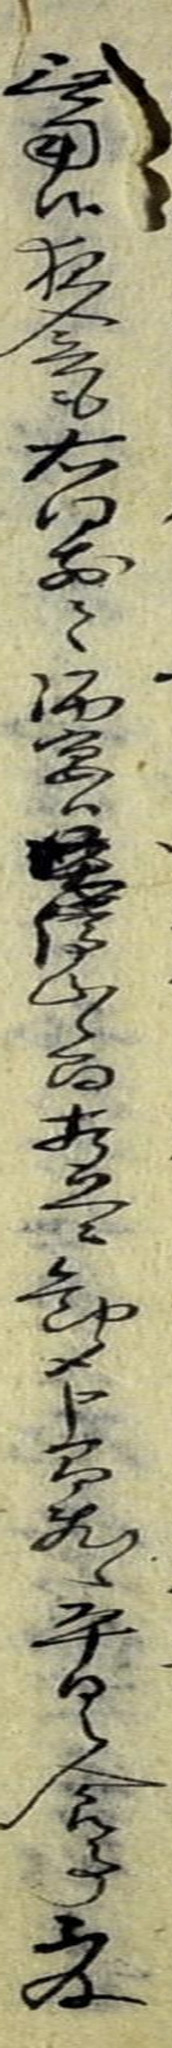無用候夜会も右同前ニ候酒宴ハ堅停止候間相互ニ勧メ申間敷候平日之食事不及
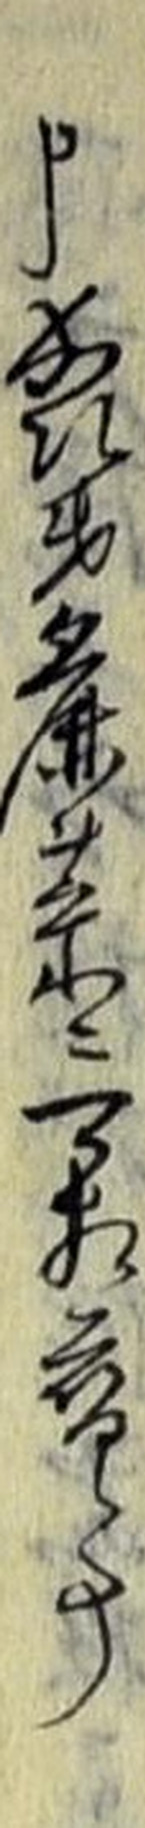申成次第麁菜ニ可相暮事
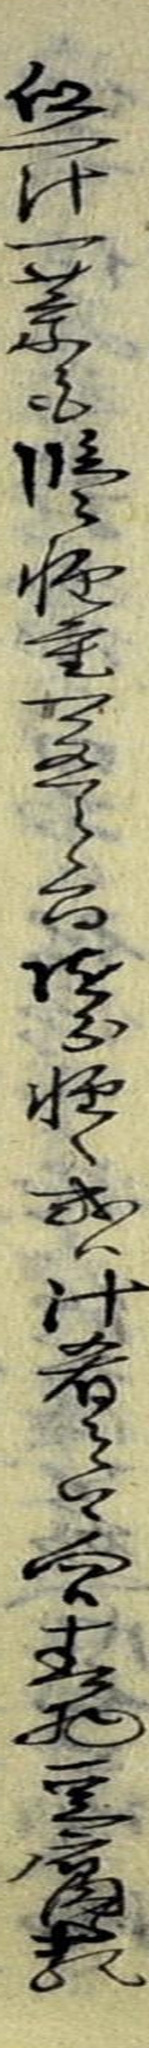但一汁一菜ニも段々軽重可有之候間随分軽く或ハ汁肴ニ候ハヽ向ハ青物豆腐類
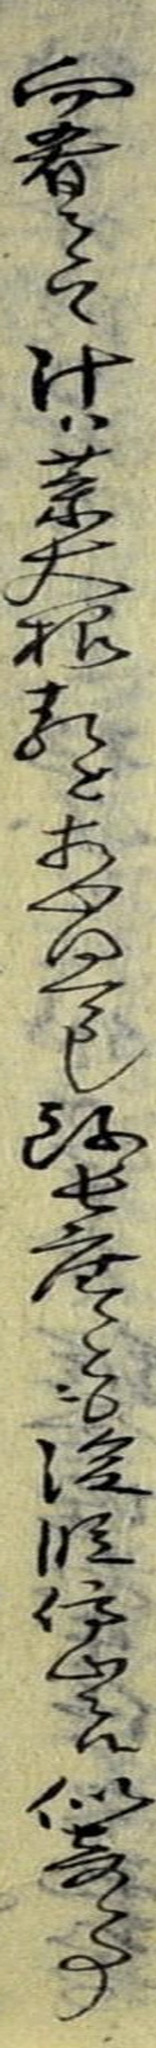向肴ニ候ハヽ汁ハ菜大根類と相心得可申候致長座候とも後段停止ニ候似寄候事
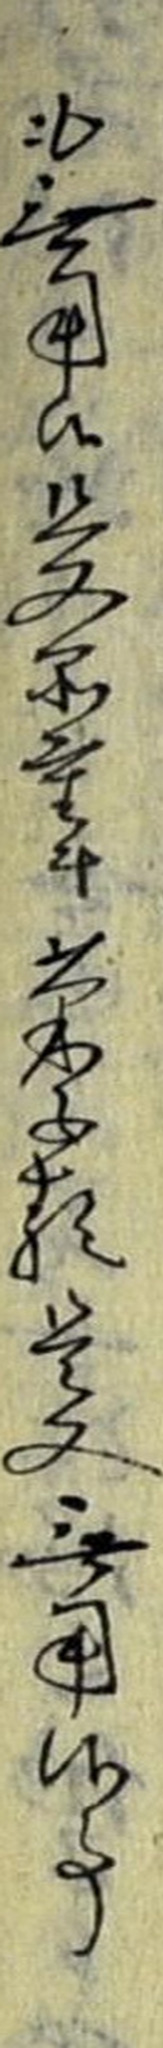も無用候且又品重キ菓子類是又無用候事
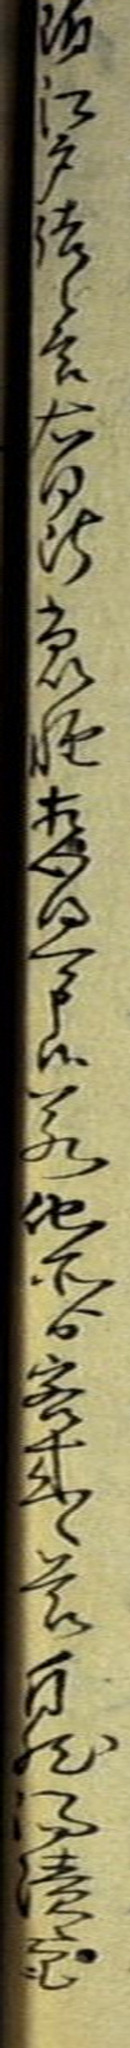附江戸詰之節右同断尚以軽相心得可申候若他所ゟ客来候節自然湯漬ニ而も
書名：命令之部 一
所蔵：福井県文書館 Fukui Prefectural Archives
